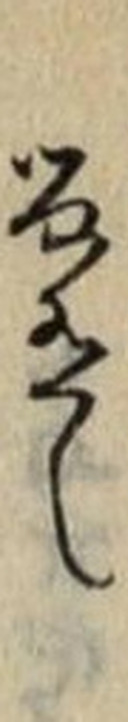留有之
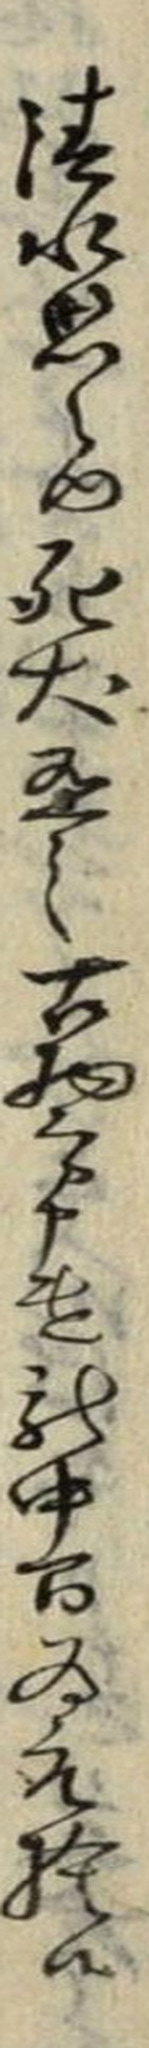一清水御門之内死犬有之古物方申遣新中間為取捨候
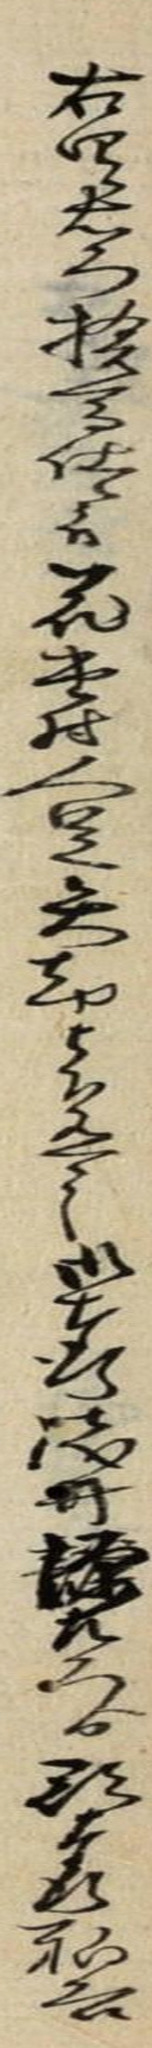右四郎右衛門捨馬仕候に付花堂村人足失却被下有之御奉行浅井源左衛門ゟ郡奉行粕谷
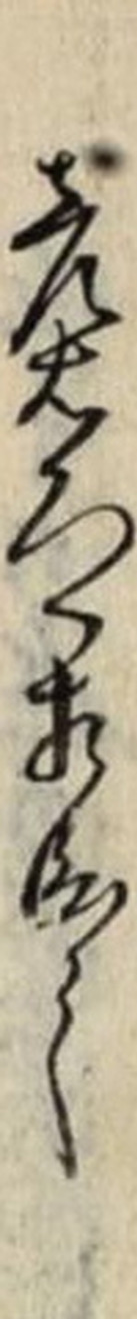彦右衛門へ相渡之
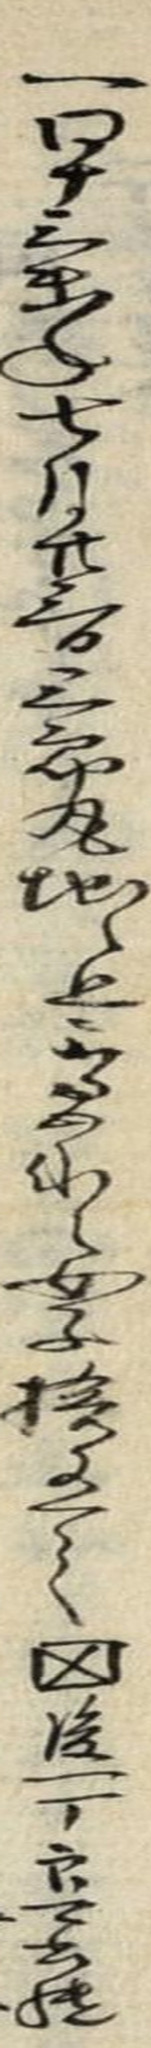一同十三未年七月廿三日三郎丸地之上当歳之女子捨有之後一丁印可書継
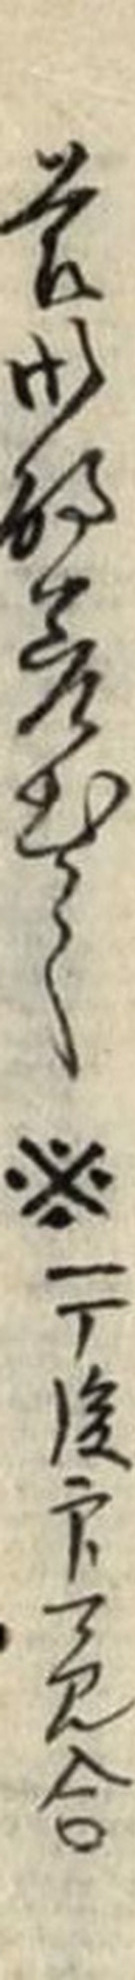節御触差出之一丁後印可見合
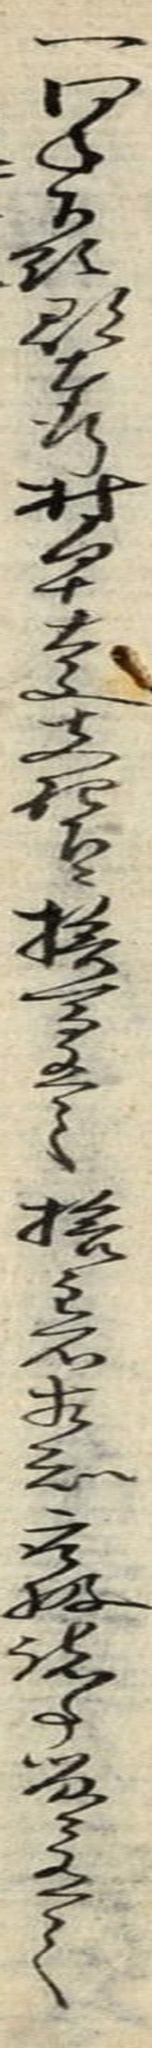一同年下領郡奉行村田十大夫支配下に捨馬有之捨主不相知取扱諸事留に有之
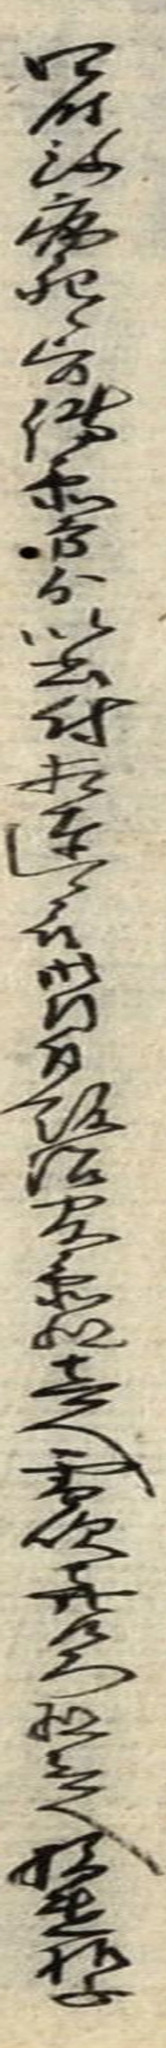四時致病死候旨伝兵衛方ゟ以書付相達候に付御目付飯沼官兵衛組壱人雪吹喜左衛門組壱人指遣様子
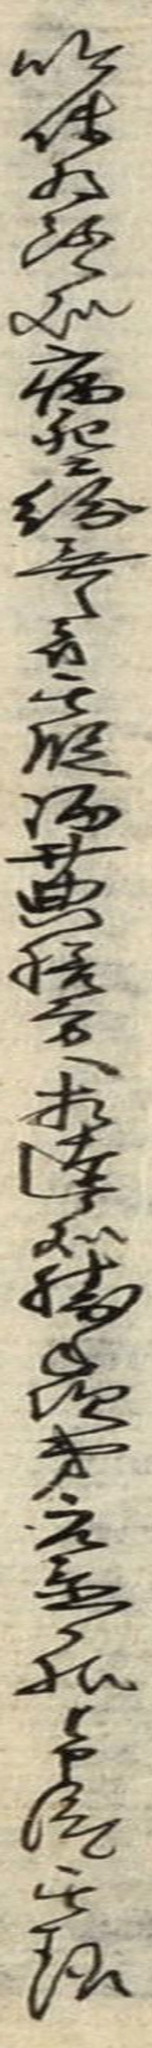吟味為致候処病死に紛無之に付其段酒井典膳方へ相達候処勝手次第取置候様被申渡候其趣
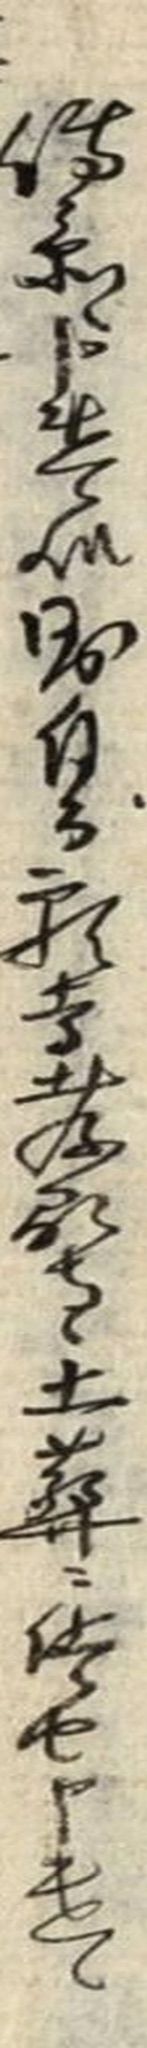伝兵衛へ申遣候処則自分願寺孝顕寺へ土葬に仕候由申遣候
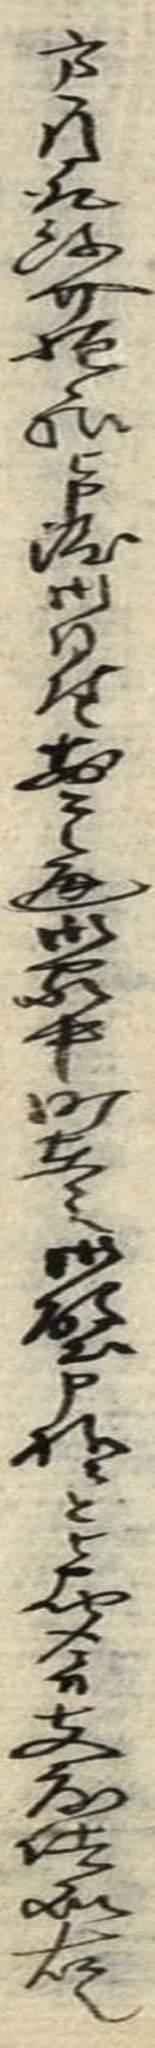方へ引取致介抱候様被申渡御目付へ前々之通御家中町在々へ御触出申様にと被申聞に付支度仕候処右之
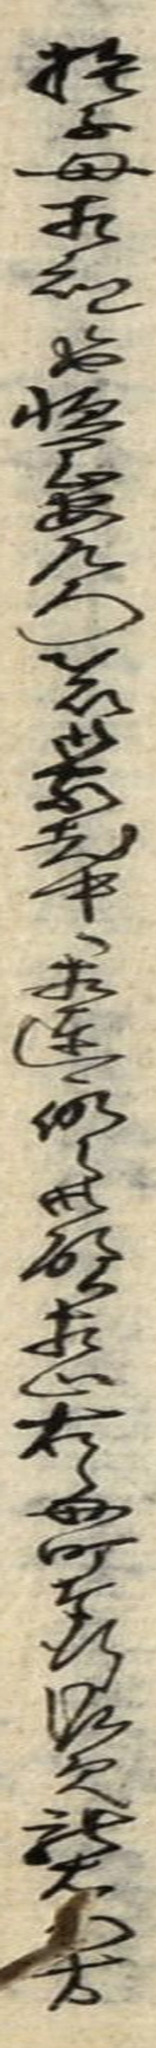捨子母相知レ候由恒岡安左衛門を以御家老中へ相達候仍之御触は相止右之母町奉行渥美新右衛門方
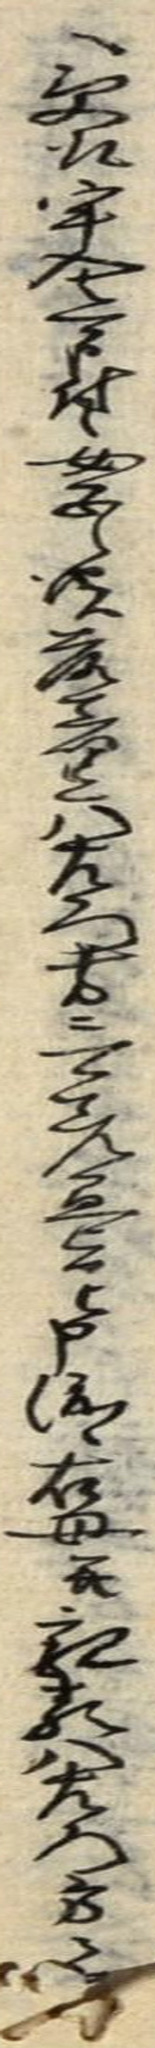へ受取牢舎可申付候女子之儀は落着迄八左衛門方に可差置旨被申渡候右母并親類八左衛門方に

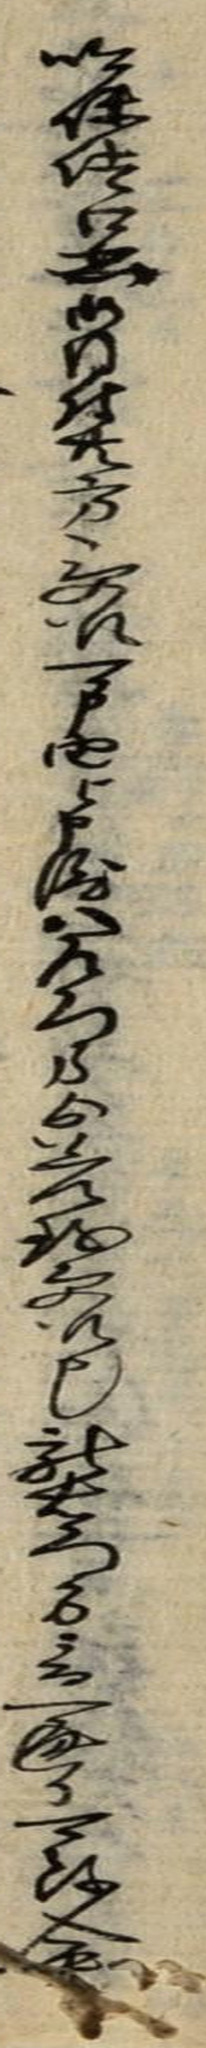吟味仕候口書御目付共方へ受取可申由被申渡八左衛門方ゟ差越受取申候新右衛門方にて一通り可致僉
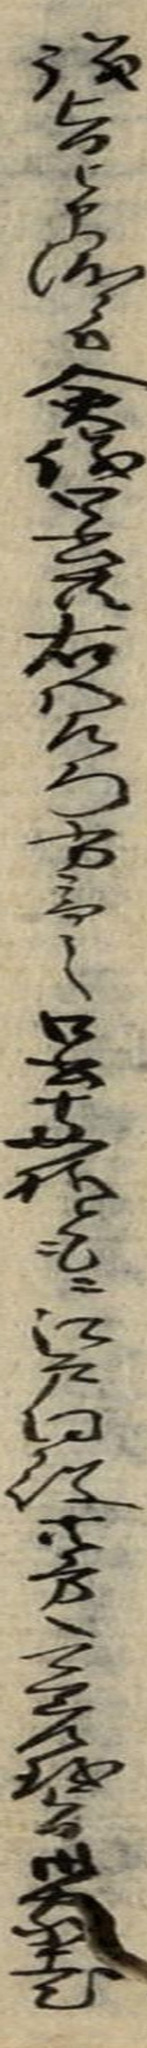議旨被申渡候に付僉議口書共右八左衛門方にて之口書両様ともに江戸同役共方へ可差越旨御家老
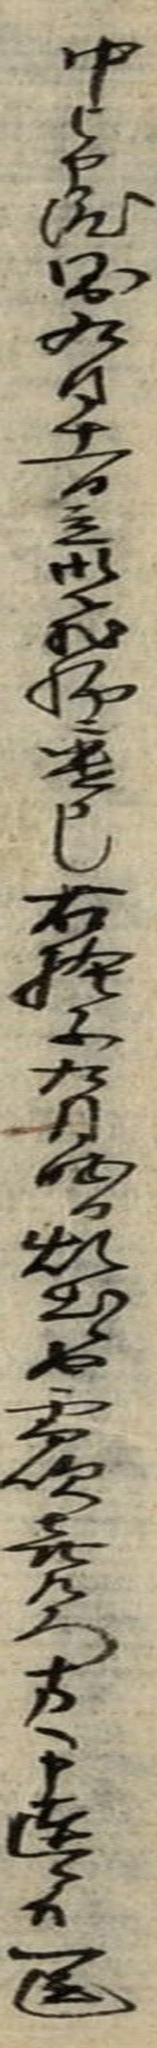中被申渡則九月十一日立御飛脚に遣申候右捨子九月晦日煩出候由雪吹喜左衛門方へ申達候付医
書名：御停止異変死失
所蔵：福井県文書館 Fukui Prefectural Archives
